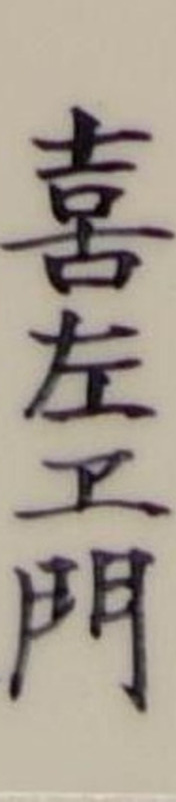喜左ヱ門
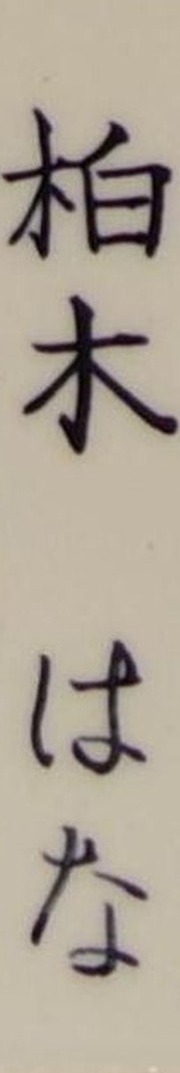柏木はな
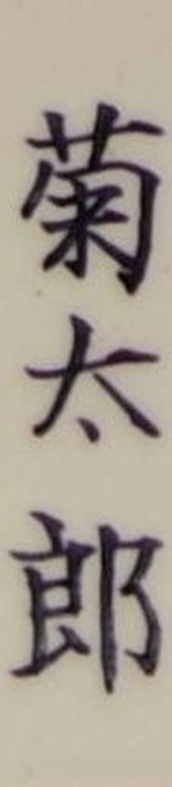菊太郎
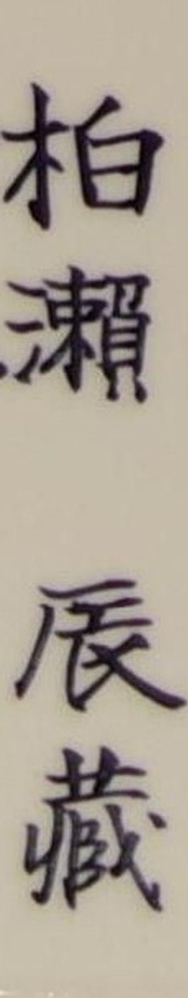柏瀬辰蔵
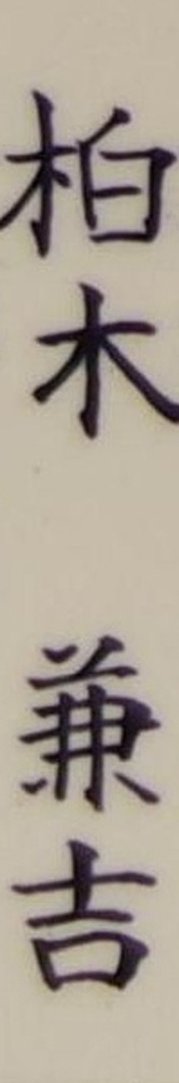柏木兼吉
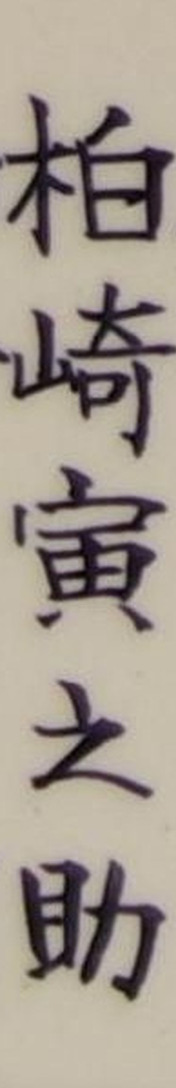柏崎寅之助
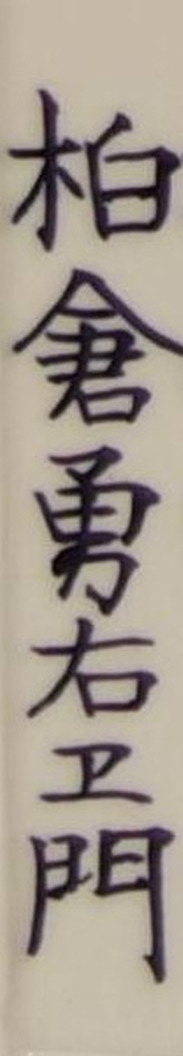柏倉勇右ヱ門

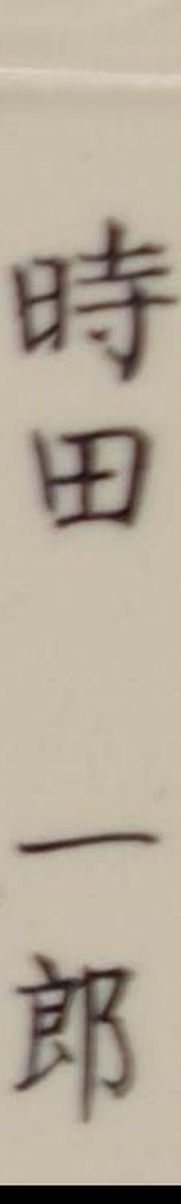時田一郎
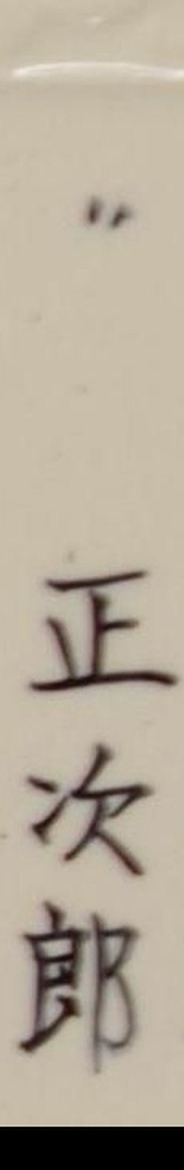正次郎
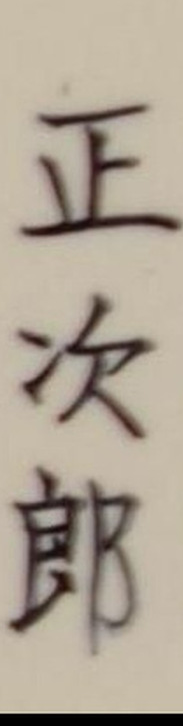正次郎
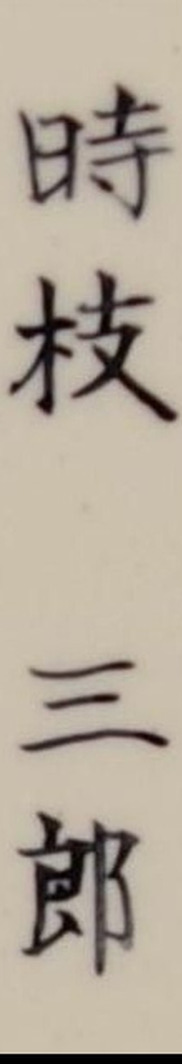時枝三郎
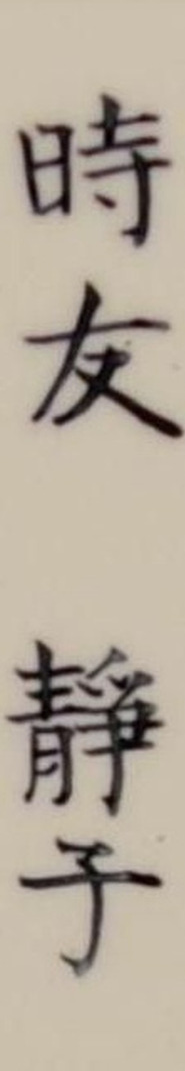時友静子
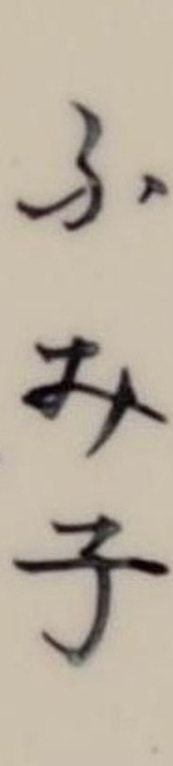ふみ子
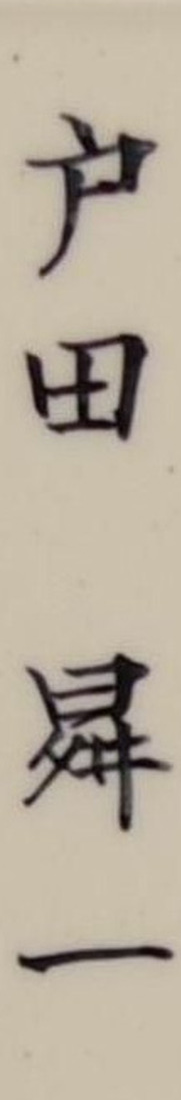戸田昇一
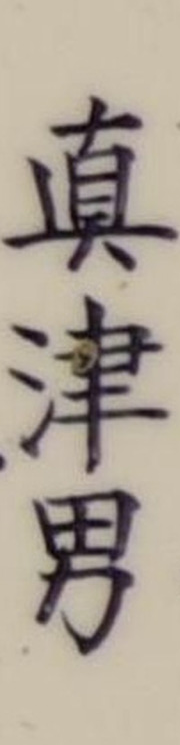真津男

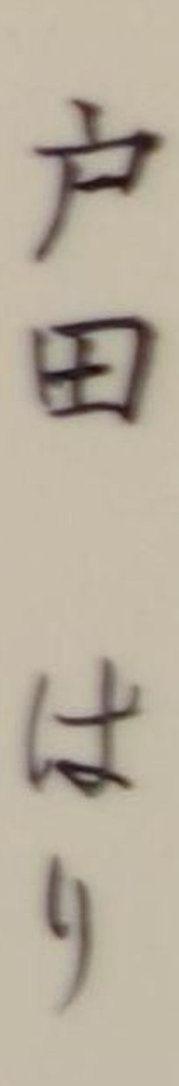戸田はり
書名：M~S
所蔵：高野山金剛峯寺
